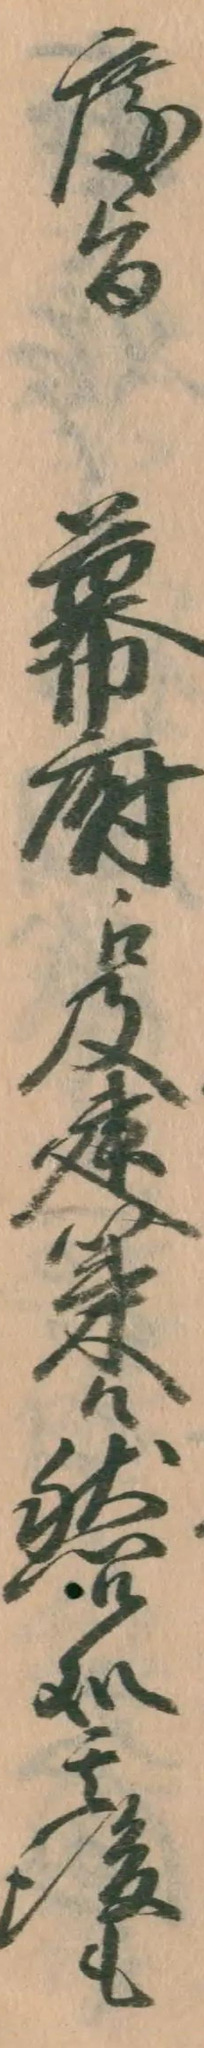度旨幕府得江及建策候然ル処其後も
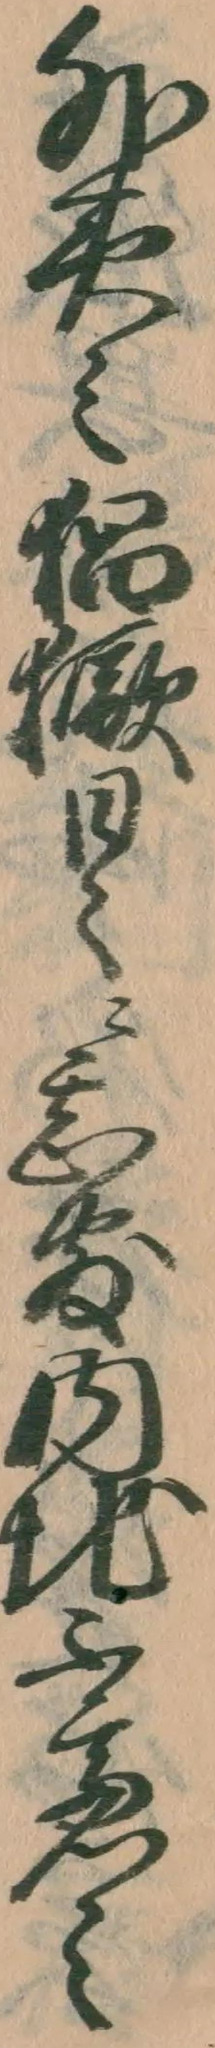外夷之猖獗日々ニ甚敷内地不慮之
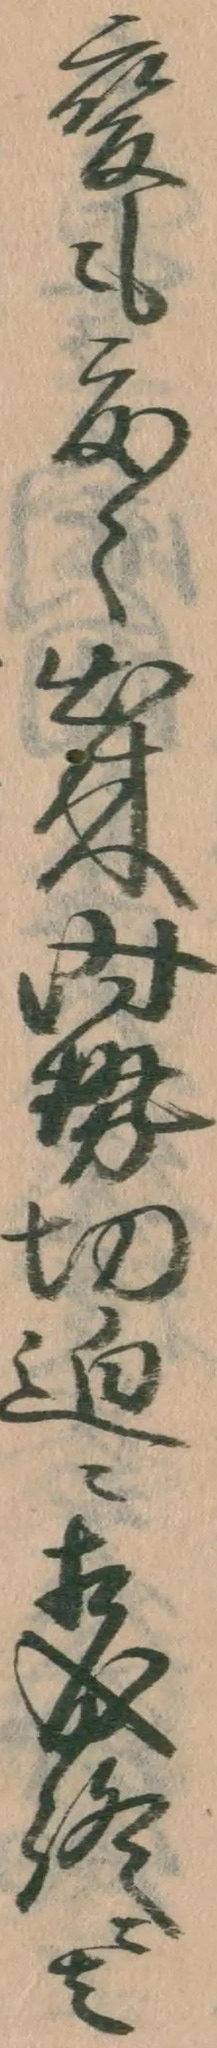変も度々出来時勢切迫二相成終ニ者
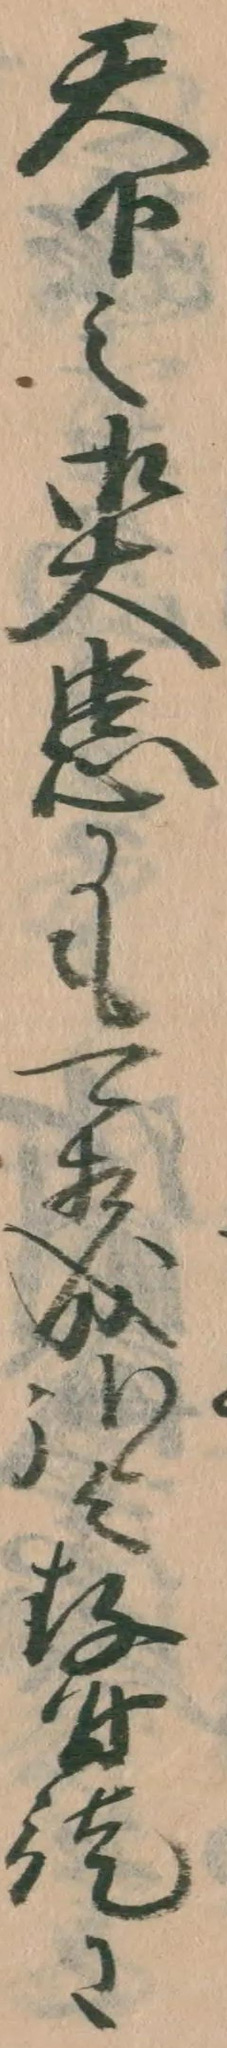天下之御大患にも可相成哉と存付徒に
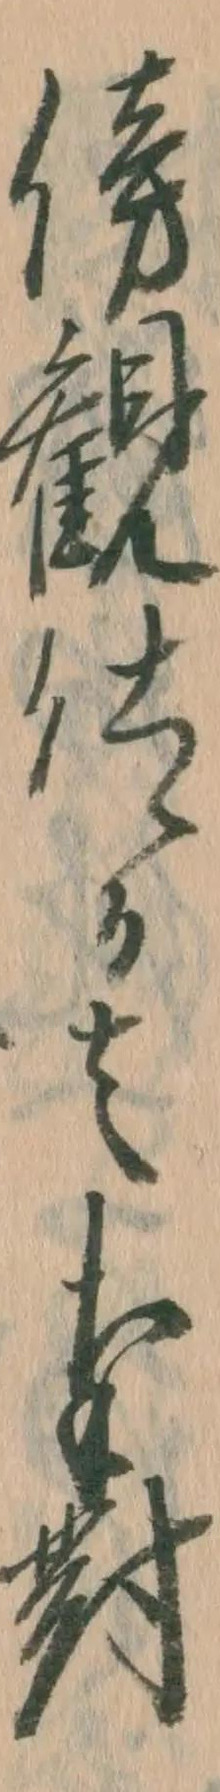傍観仕候而者奉對
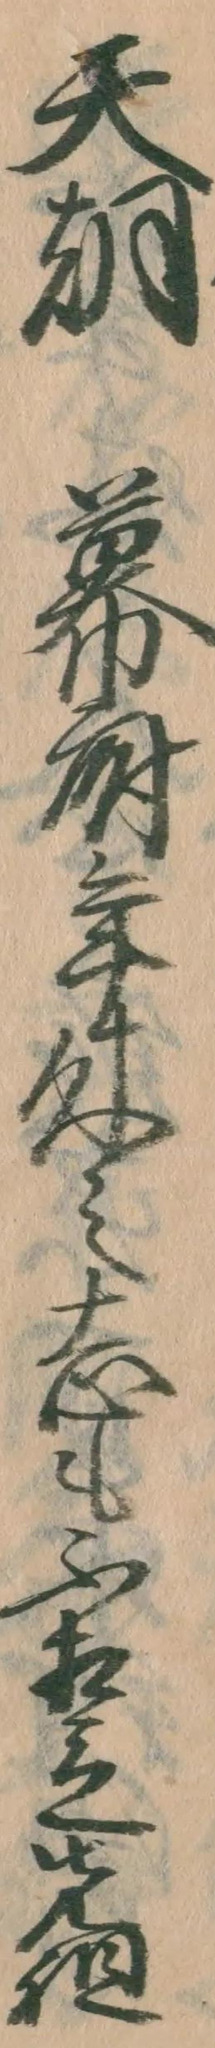天朝幕府年来之志も不相立先祖
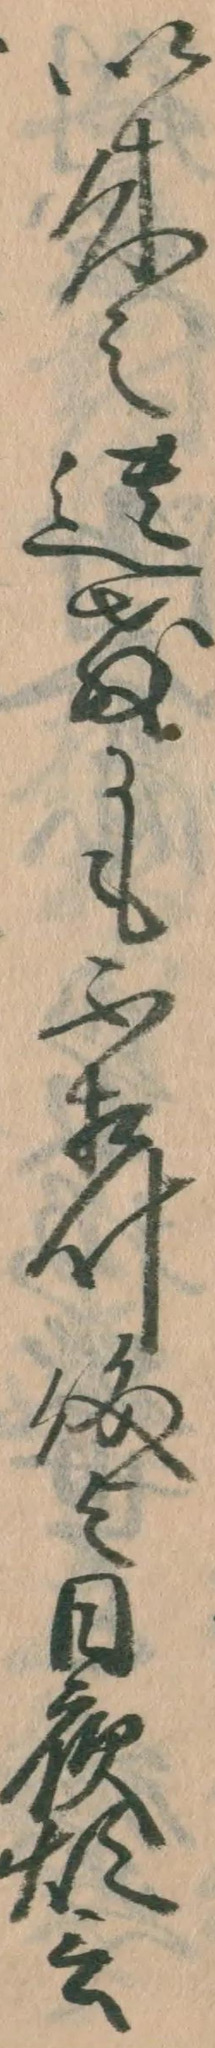以来之遺教にも不相叶儀と日夜煩言
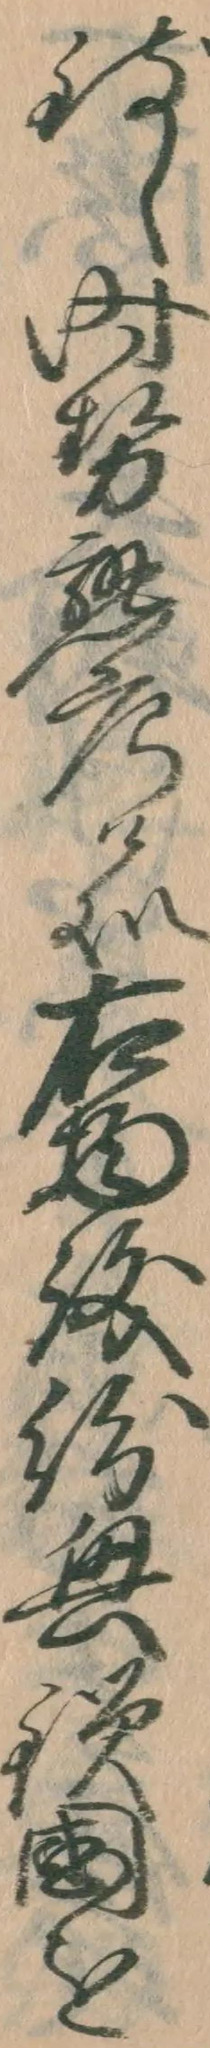致し時勢熟考候処右物議紛興鎖国を
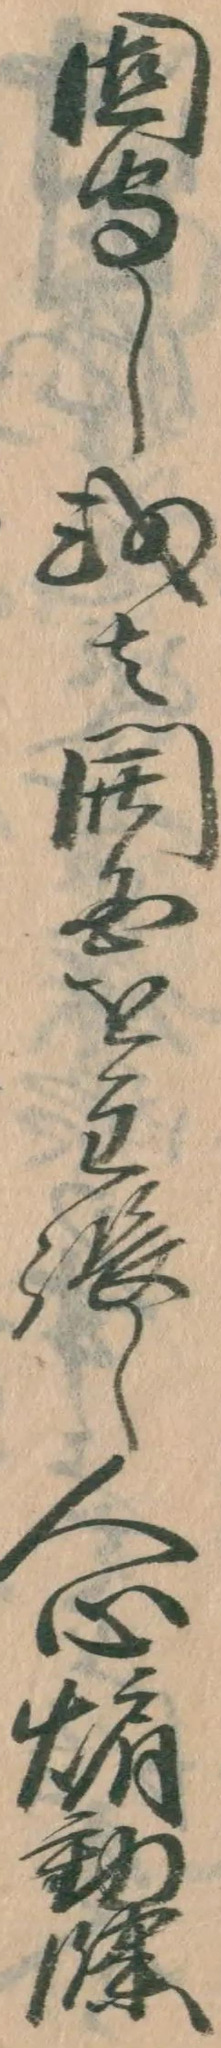固守し或者開国を主張し人心煽動餘
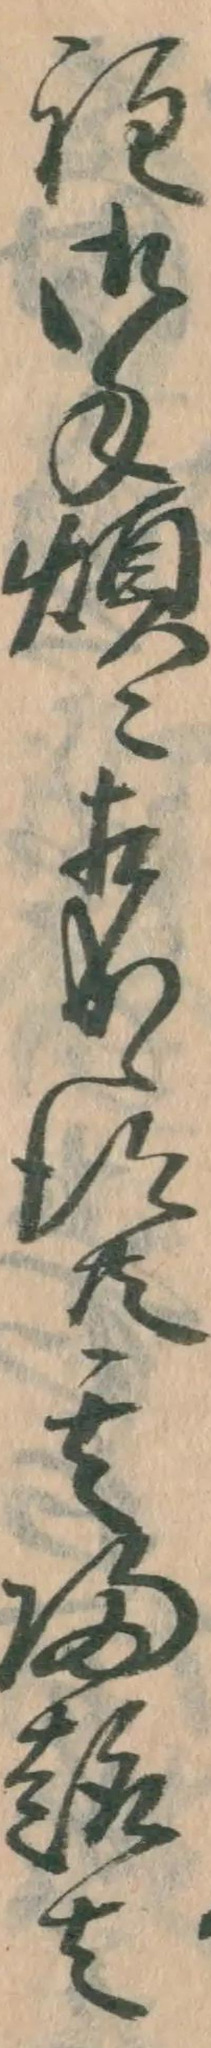程御手煩ニ相成候得共其帰趣者
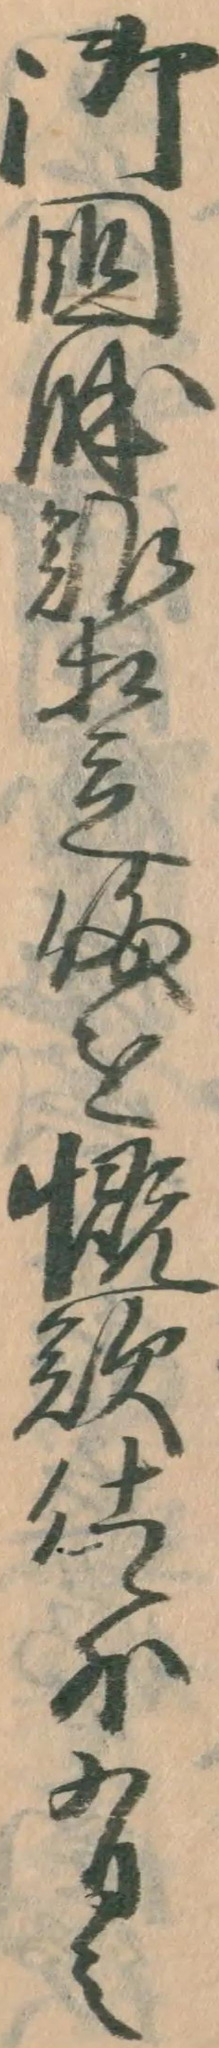御国躰難相立儀を慨歎仕候外有之

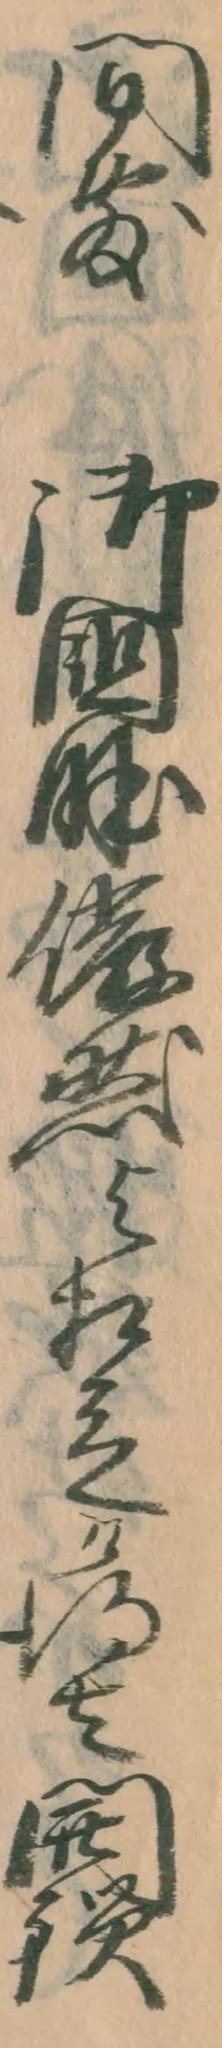間敷御国躰儼然と相立候得者開鎖
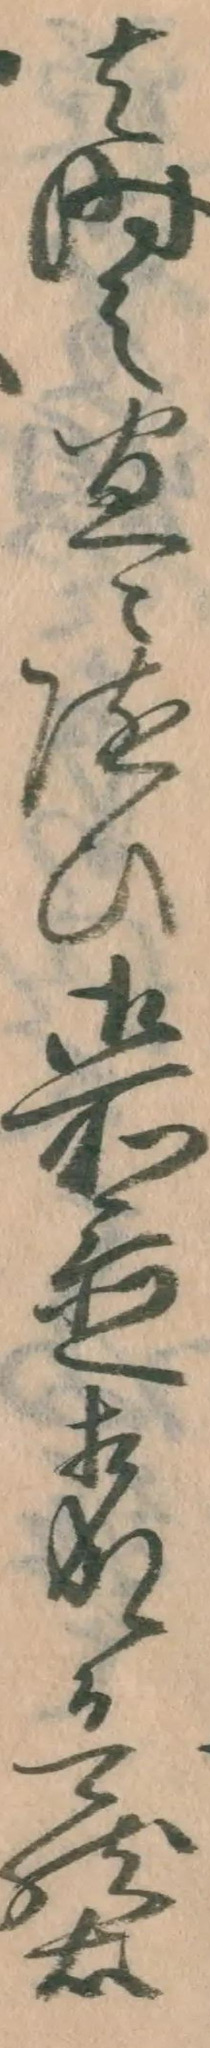者時之宜ニ随ひ御所置相成候而可然右
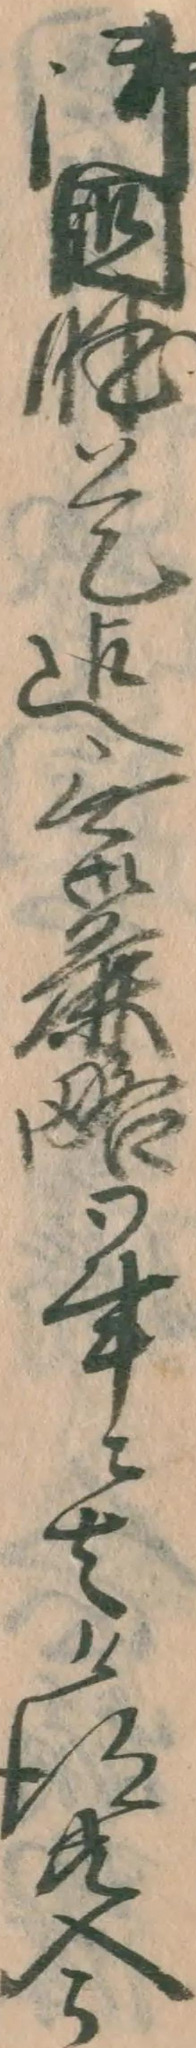御国躰是迄無御麁略御事ニ者候得共今
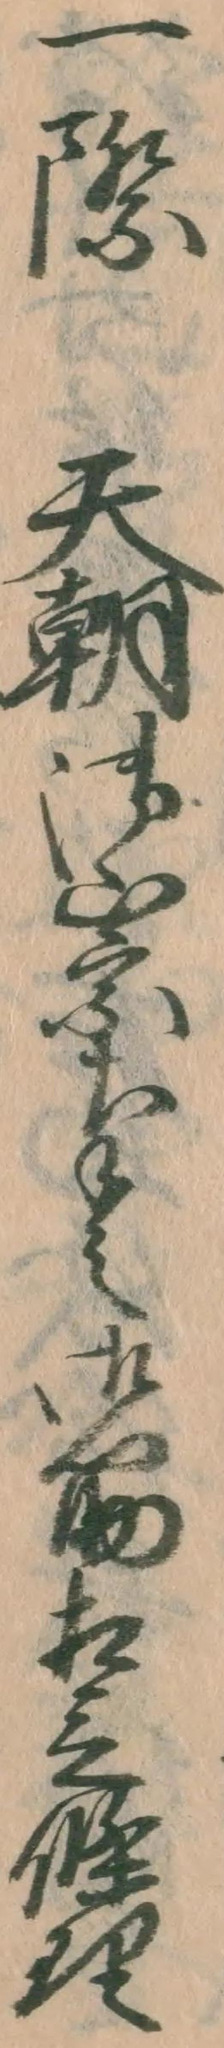一際天朝御崇奉之御筋相立條理
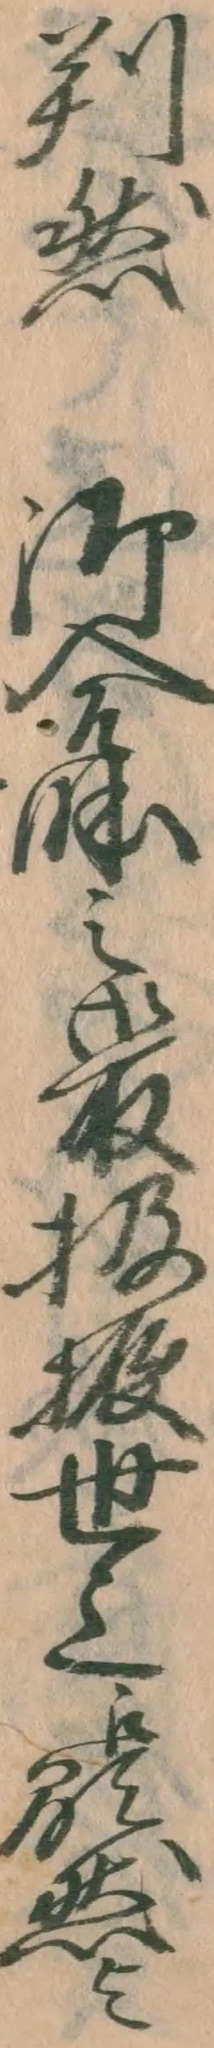判然御合躰之御取扱振世上え顕然と
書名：麗斎叢書. 20
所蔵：国立国会図書館 National Diet Library, JAPAN
